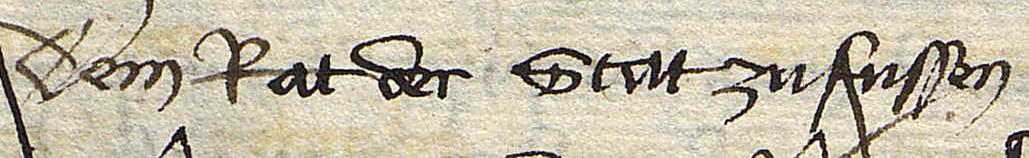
Dem Rat der Stat ʒu fuſſen
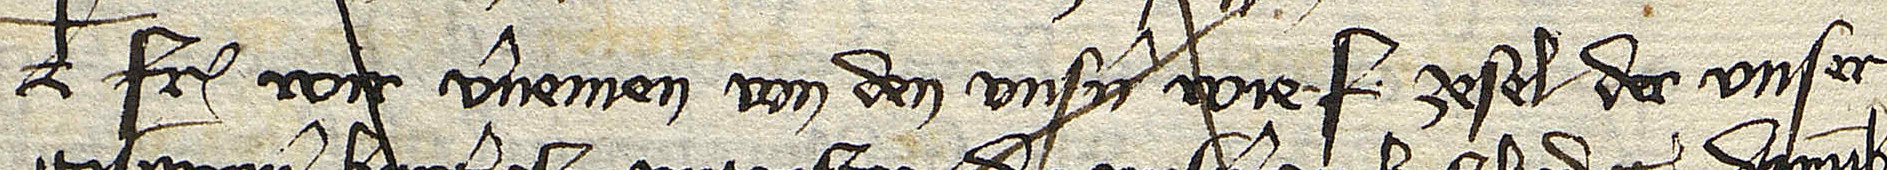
L* fr* wir v*nemen von den vnſn* wie . F . ʒefel der vnſer
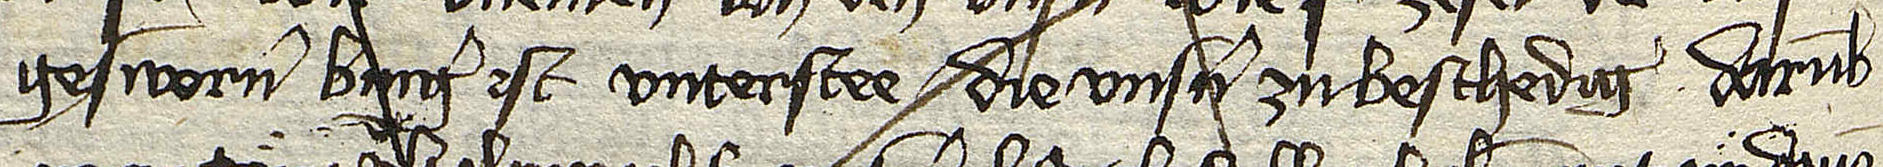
geſworn* burg* iſt vnterſtee / Die vnſn* ʒu beſchedig* Darub*
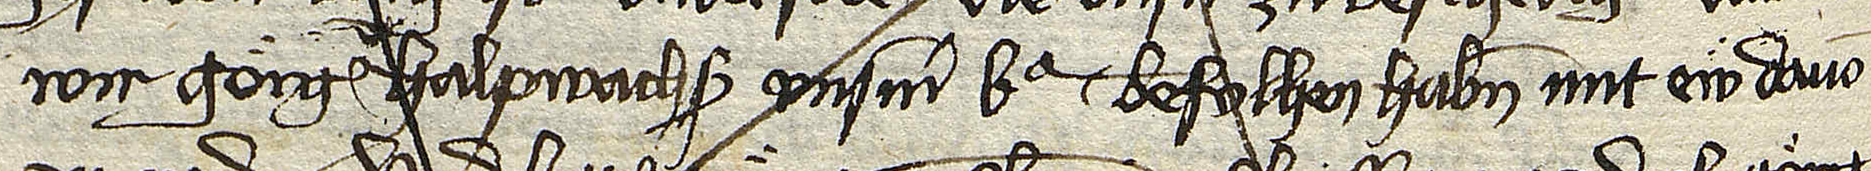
wir görg* halpwachſ* vnſm* b* / befolhen habn* mit eẅ dauo*
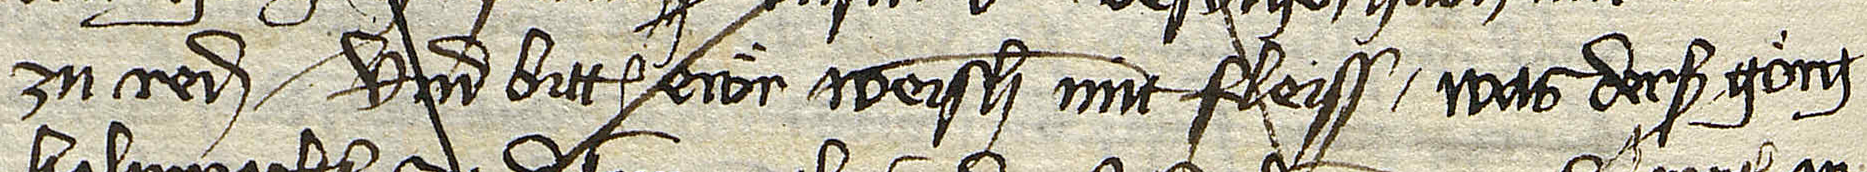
ʒu red* / Vnd bitt* eẅr weiſh* mit fleiſſ / was derſ* görg
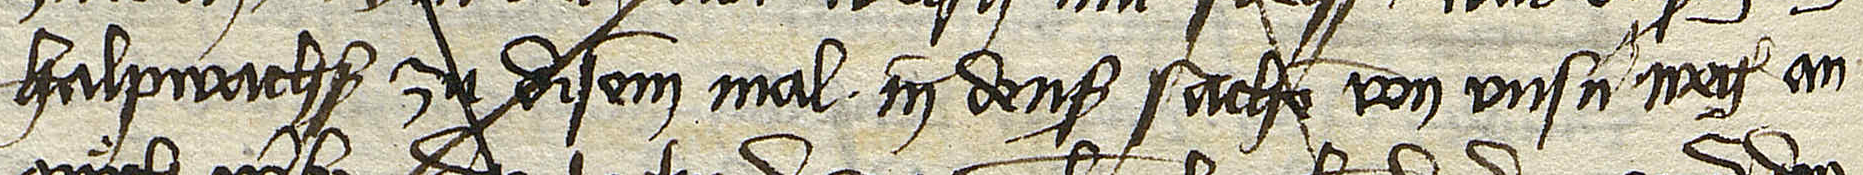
halpwachſ* ʒu diſem mal . in denſ* ſache* von vnſn* weg* an
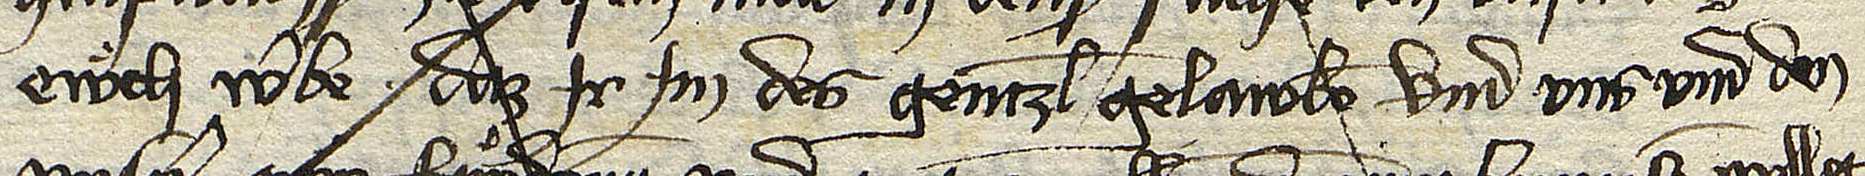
eẅch w*be . daʒ Ir Im des gencʒl* gelawbe* Vnd vns vnd den
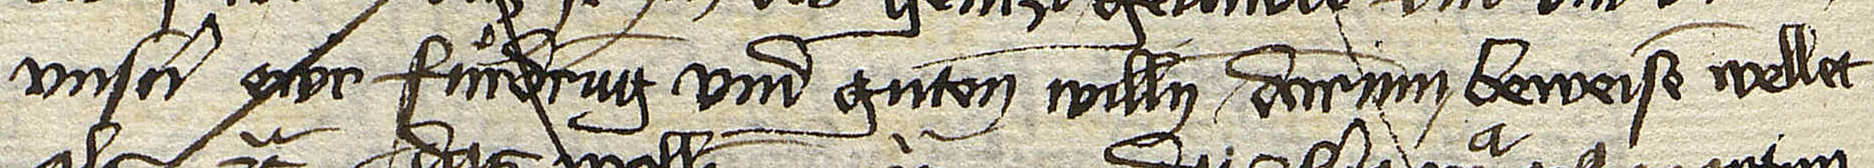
vnſn* eẅr fürdru*g vnd guten willn* / darinn beweiſe* wellet
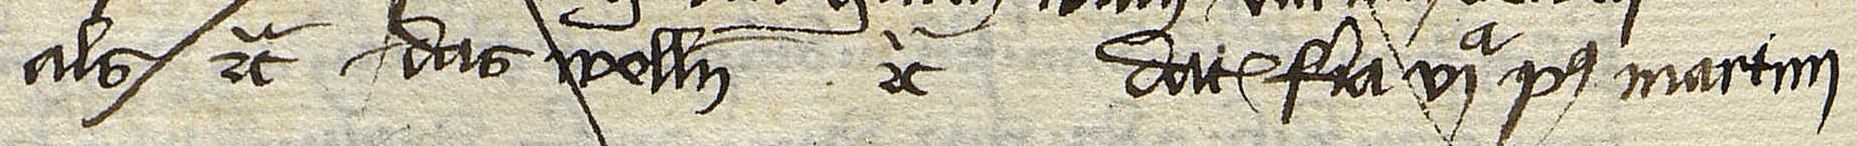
als ec* / das welln* ec* dat* fi*a vi* p* martini
